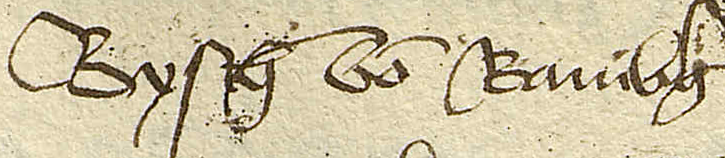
Byſch* vo* Bambg*
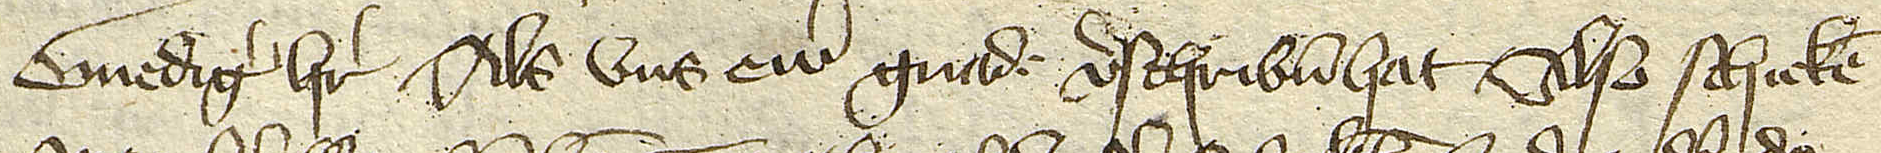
Gnedig* hr* / Als vns ew* gnade v*ſchribn* hat / Alſo ſchicke*
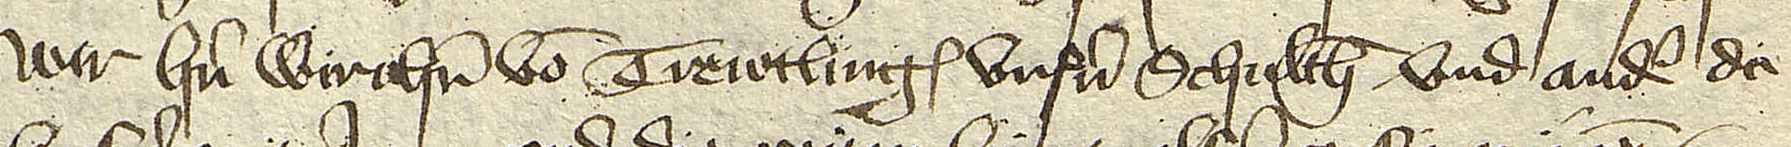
wir hn* wirichn* vo* Trewtling* vnſn* Schulth* / vnd and* die
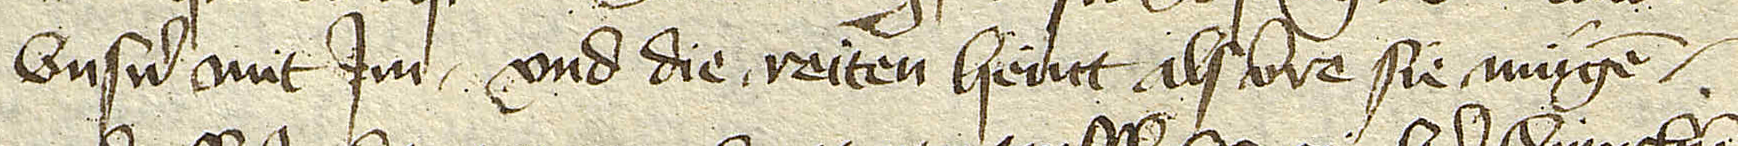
vnſn* mit Im / vnd die reiten heutt alſ v*re ſie müge* / .
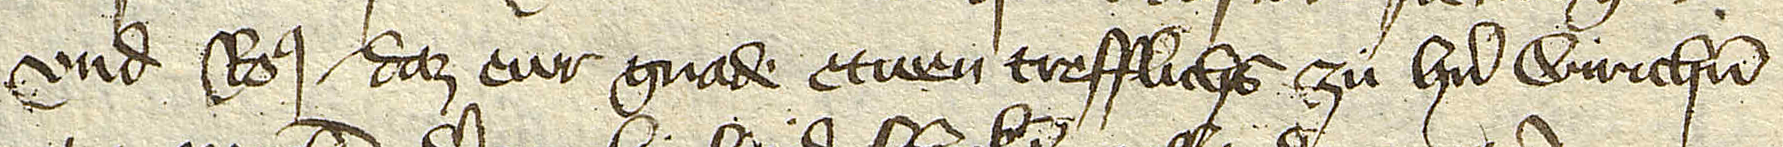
vnd Ro* / daʒ ewr gnade etwen trefflichs cʒu hn* wirichn*
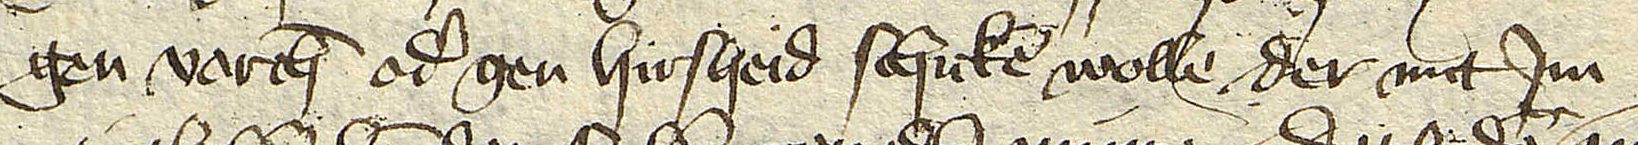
gen vorch* od* gen hirſheid ſchicke* wolle / der mit Im
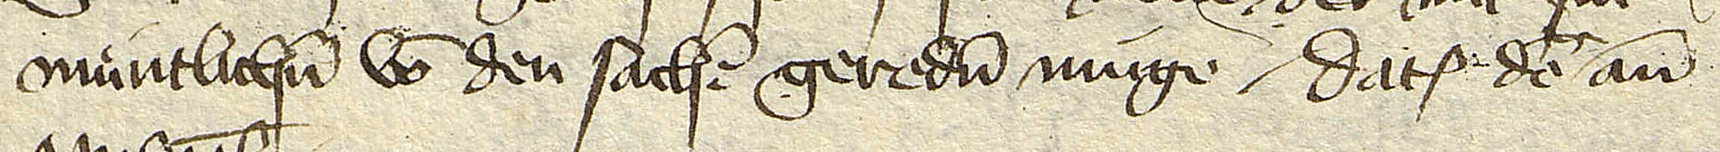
müntlichn* vo* den ſache* geredn* müge / Dat* de* an*
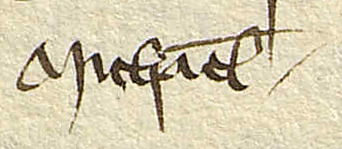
Michael* /
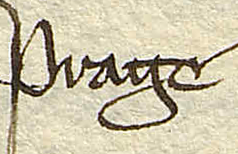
Prage
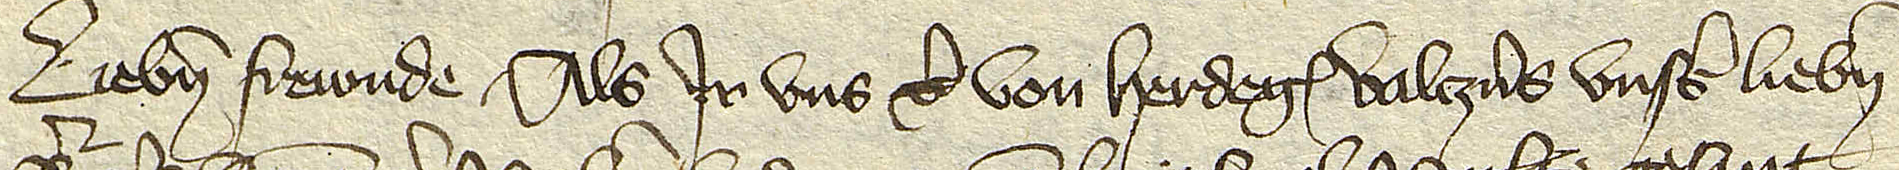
Liebn* frewnde / Als Ir vns v* von herdeg* Valcʒn*s vnſs* liebn*
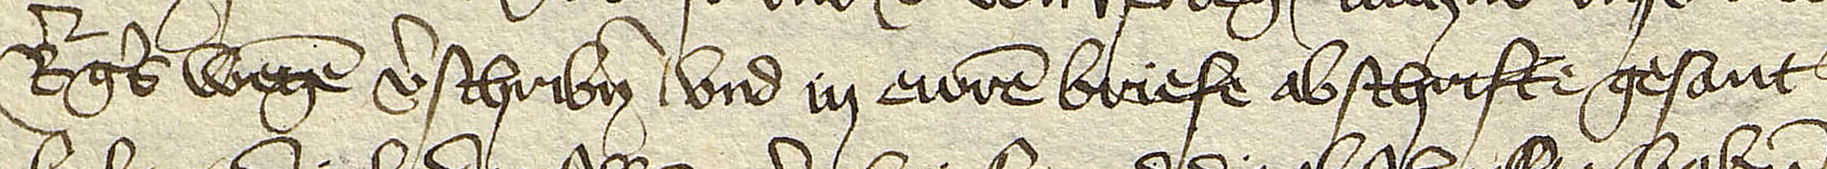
B*g*s wege* v*ſchribn* / vnd in ewre* briefe abſchrifte geſant
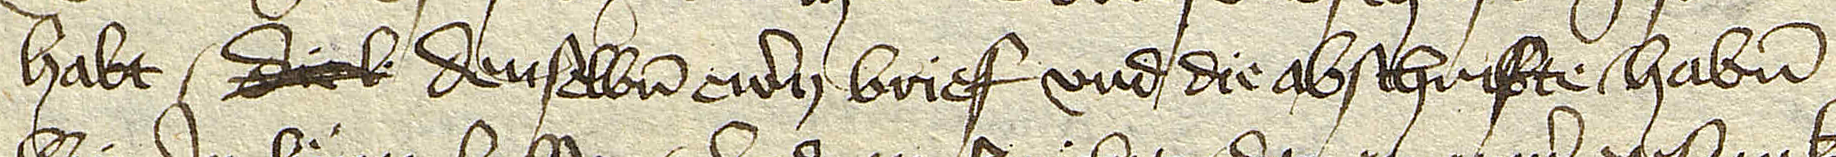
habt / die l denſelbn*ew*n brief vnd die abſchrifte / habn*
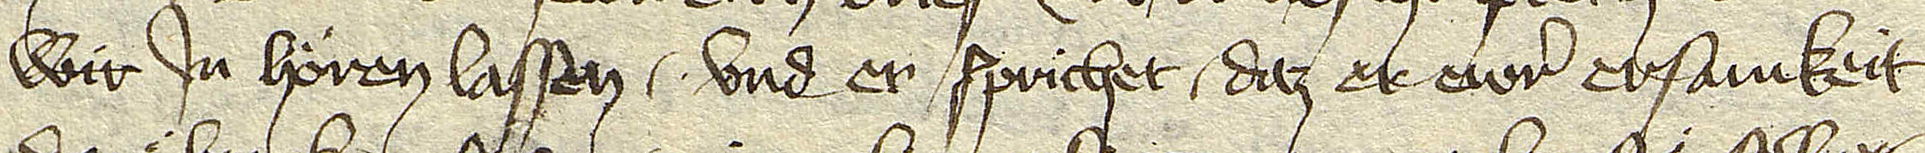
wir In hören laſſen / . vnd er ſprichet / daʒ er ewr* erſamkeit
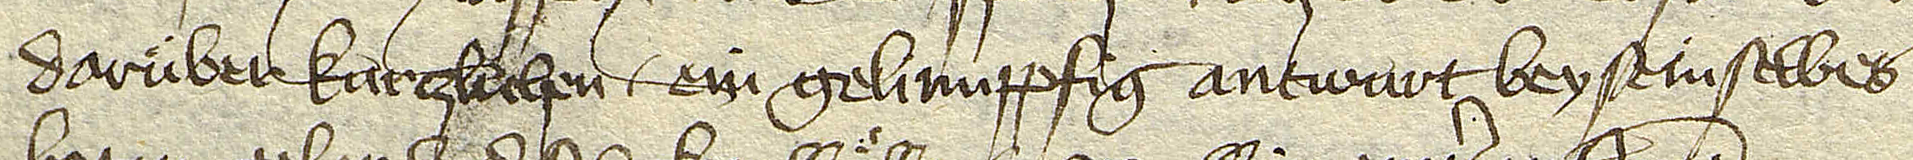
darüber kurcʒlichen / ein gelimppfig antwurt bey ſein ſelbes
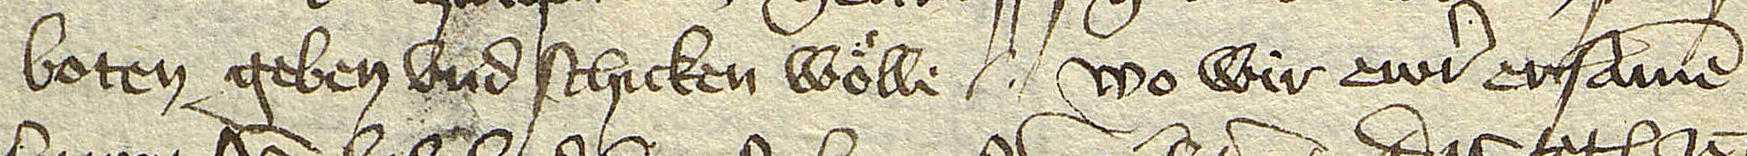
boten geben vnd ſchicken wölle / . wo wir ewr* erſame*
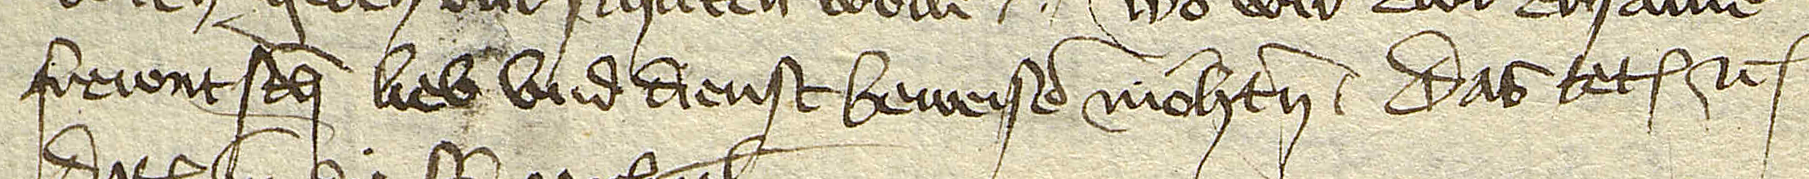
frewntſch* lieb vnd dienſt beweiſe* möhtn* / Das tet* ec*
